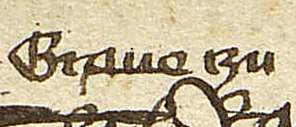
Graue cʒu
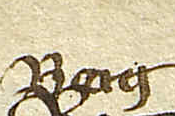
Berg
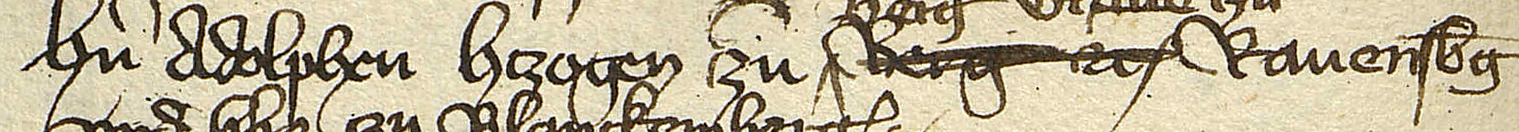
hn* Adolphen h*cʒogen cʒu Berg ec* Rauenſb*g
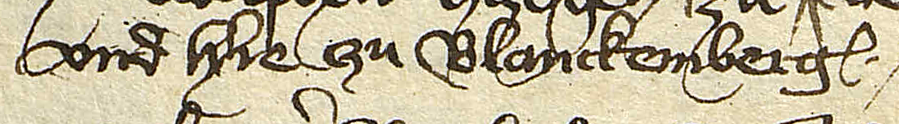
vnd h*re cʒu Blanckemberg* /
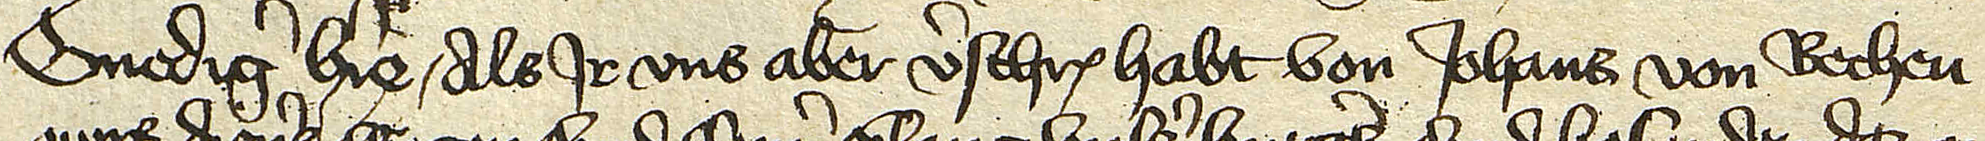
Gnedig* h*re / Als Ir vns aber v*ſchr* habt von Iohans von Bechen
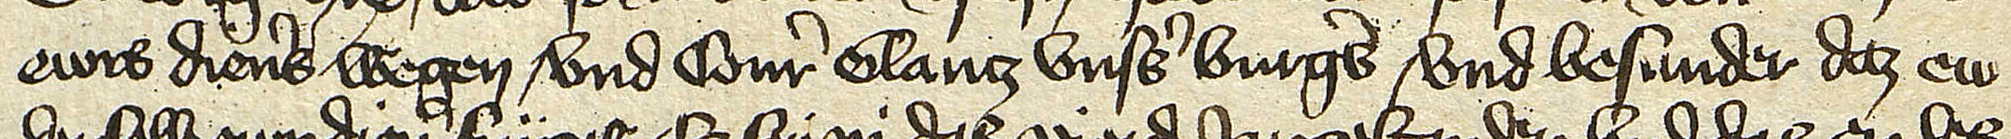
ewrs diens* wegen / vnd Conr* Glancʒ vnſs* burg*s / vnd beſunder daʒ ew
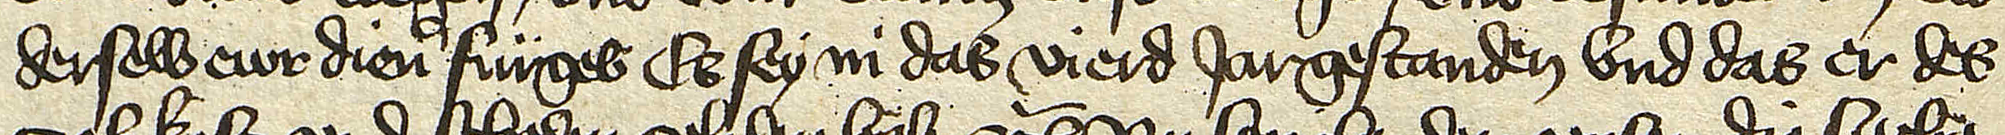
derſelb ewr dien* fürgeb Es ſey in das vierd Iar geſtanden vnd das er des
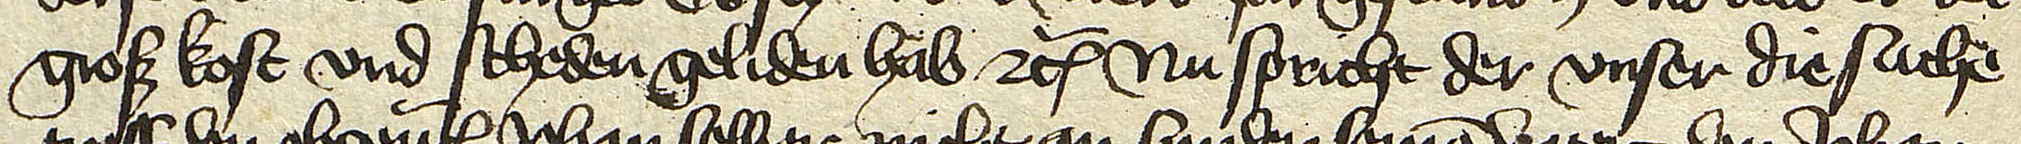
groſʒ koſt vnd ſcheden geliden hab ec* Nu ſpricht der vnſer die ſache
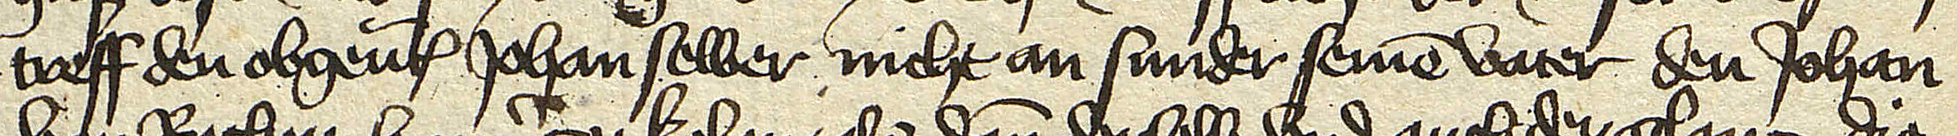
treff den obgent* Iohan ſelber nicht an ſunder ſeine* vater den Iohan
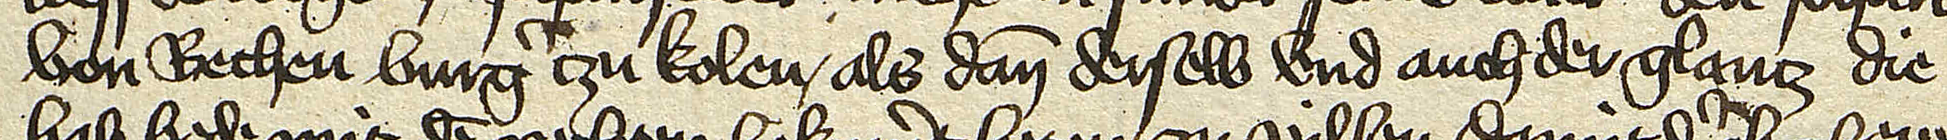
von Bechen burg* cʒu kolen / als dan* derſelb vnd auch der glancʒ die
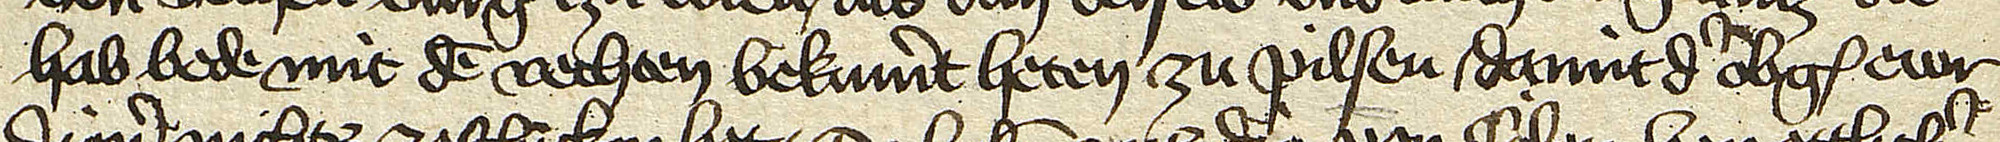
hab bede mit de* rechten bekumt* heten cʒu pilſen / damit d* obg* ewr
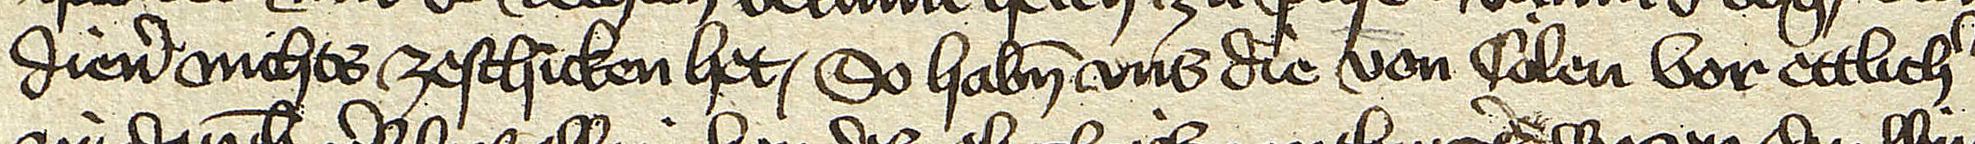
dien* nichts cʒeſchicken het / So habn* vns die von Cölen vor ettlich*
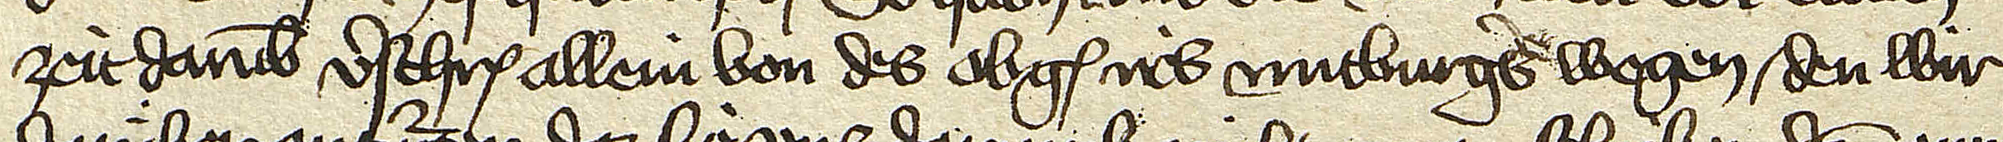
cʒeit darub* v*ſchr* allein von des obg* irs mitburgs* wegen / den wir
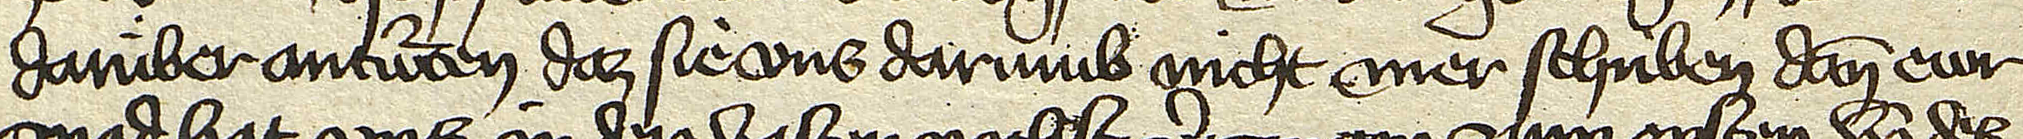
darüber antwten* daʒ ſie vns darumb nicht mer ſchriben dan* ewr
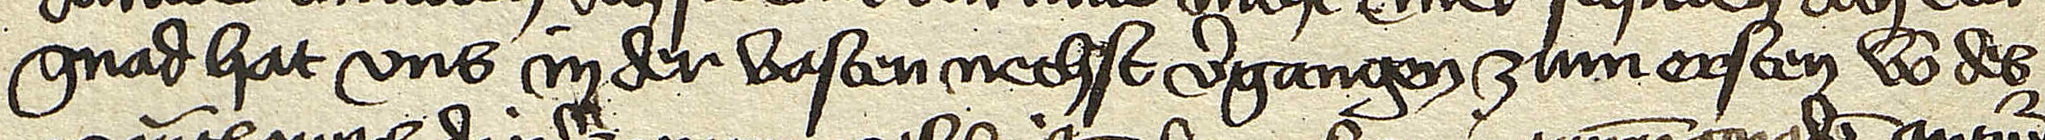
gnad hat vns in der vaſten nechſt v*gangen cʒum erſten vo* des
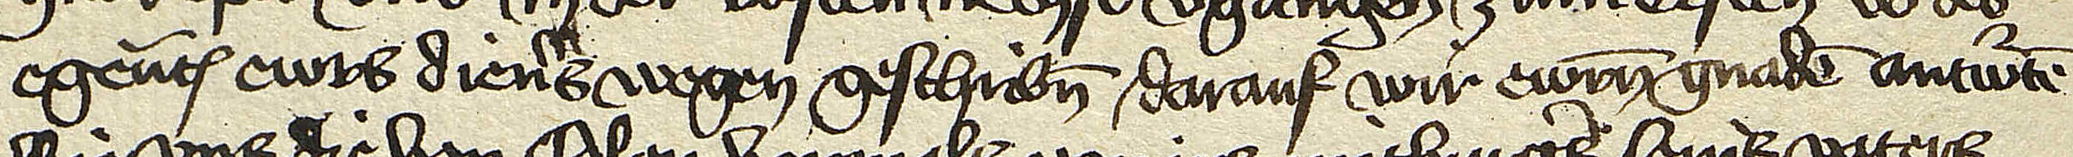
egent* ewrs dien*s wegen geſchribn* / darauf wir ewrn* gnade* antwte*
